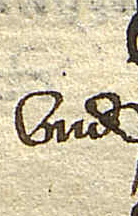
vnd
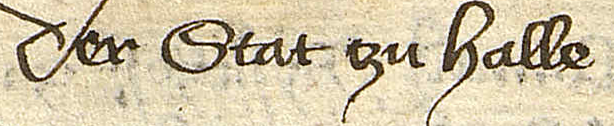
Der Stat cʒu halle
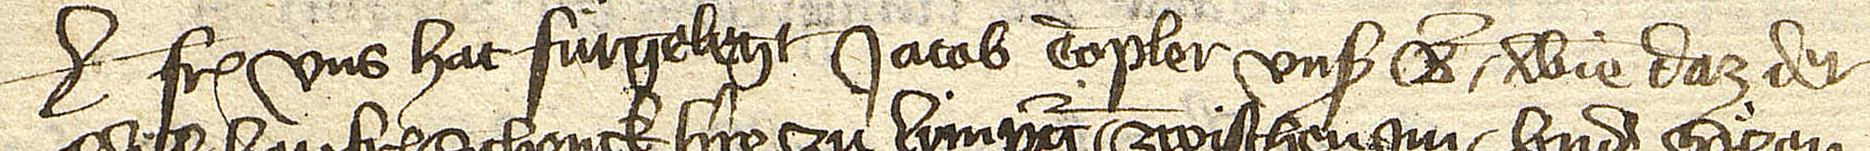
L* fr* vns hat fürgelegt Iacob Topler vnſ* B* / wie daʒ der
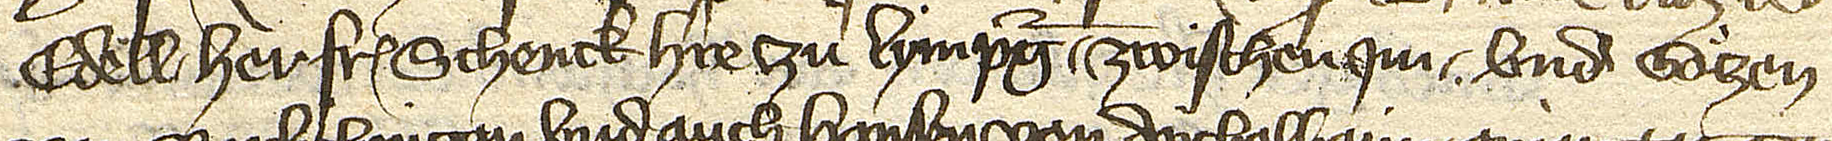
Edell / her fr* Schenck h*re cʒu lympg* / cʒwiſchen Im / vnd Göcʒen
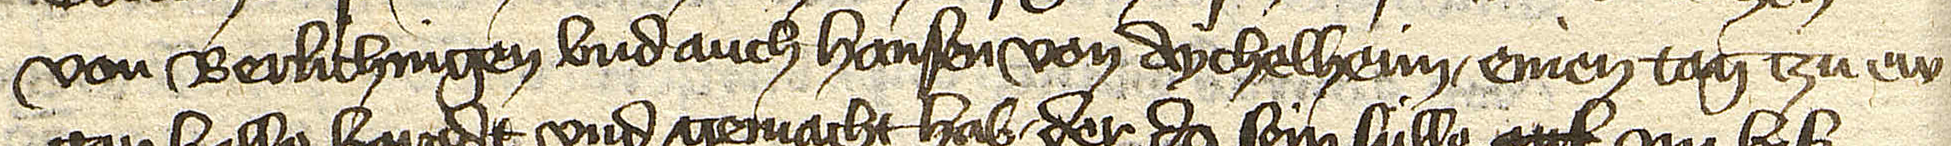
von Berlichingen vnd auch hanſen von Aychelheim / einen tag cʒu ew
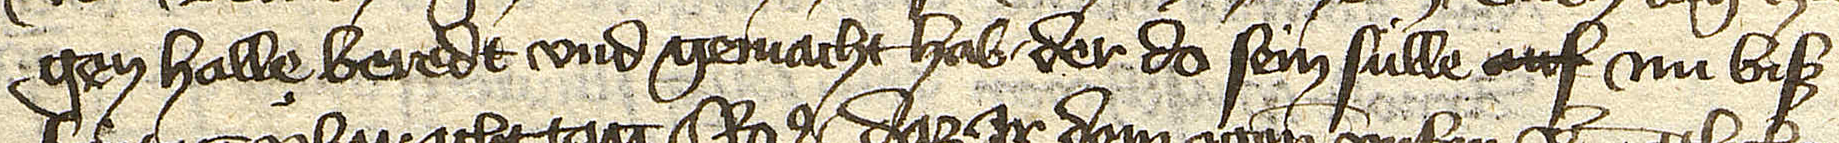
gen halle beredt vnd gemacht hab / der do ſein ſülle auf nu biſʒ
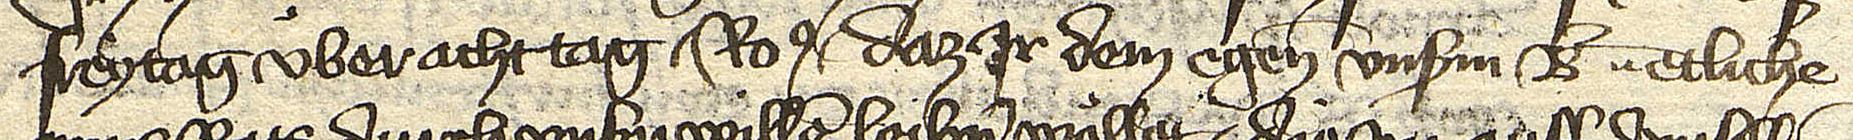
freytag v̈ber acht tag / Ro* / daʒ Ir dem egen* vnſ*m B* ~ etliche
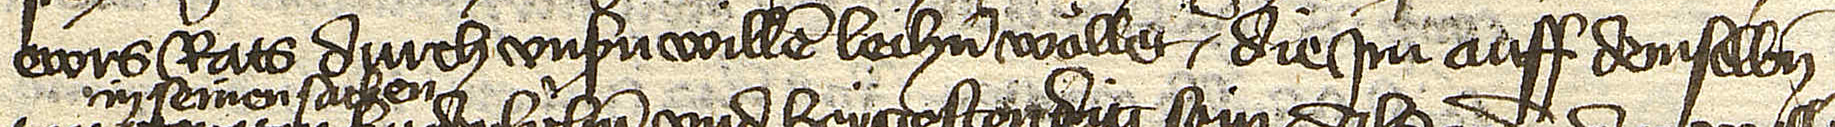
ewrs Rats durch vnſ*n wille* leihn* wöllet / die Im auff demſelbn*
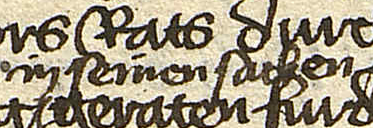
in ſeinen ſachen
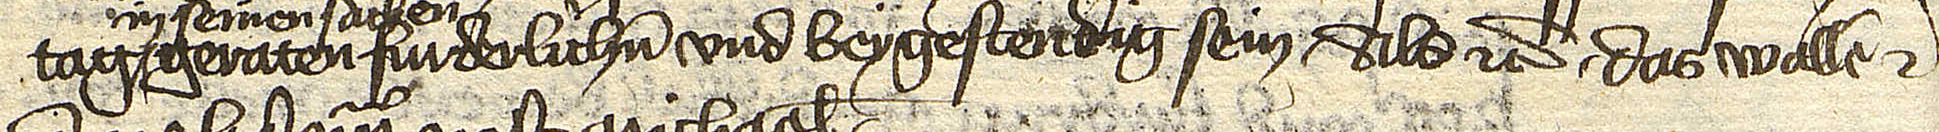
tag geraten fürderlichn* vnd beygeſtendig ſein / Als ec* / das wolle* ec*
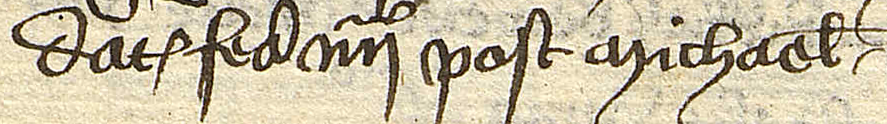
dat* fea* iiii* poſt Michael* /
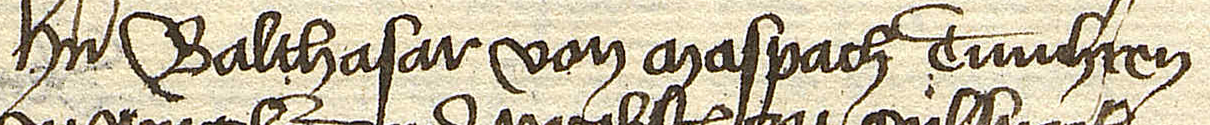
hn* Balthaſar von Maſpach Tumh*ren
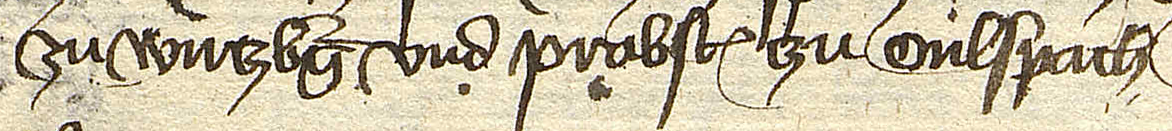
cʒu wirʒbg* vnd Probſt* cʒu Onlſpach
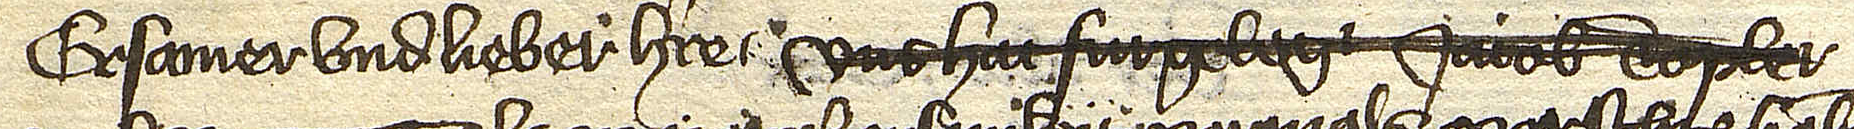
Erſamer vnd lieber h*re / vns hat furgelegt Iacob Topler
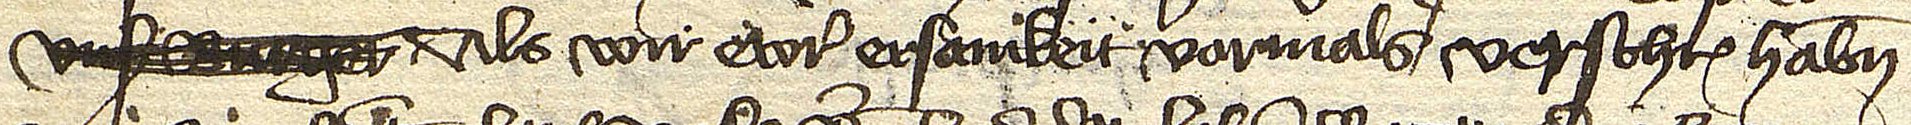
vnſ* Burger / Als wir ewr* erſamkeit vormals verſchr* habn*
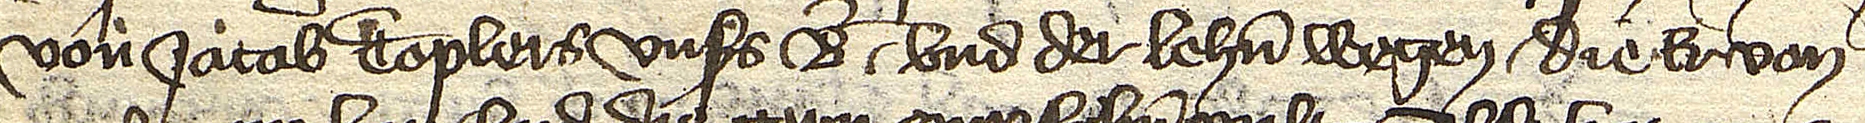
von Iacob Toplers vnſ*s B* / vnd der lehn* wegen / die Er von
